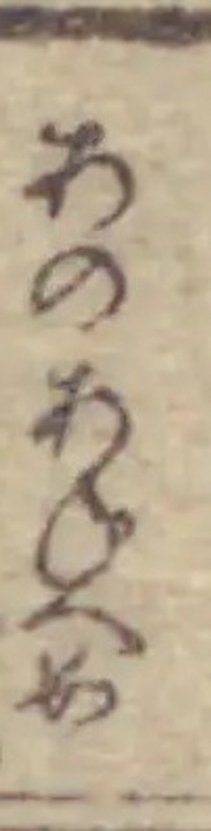あのあねへめは
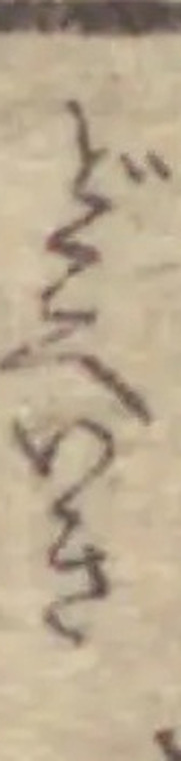どこへいき
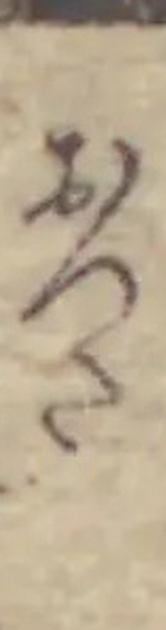おつた
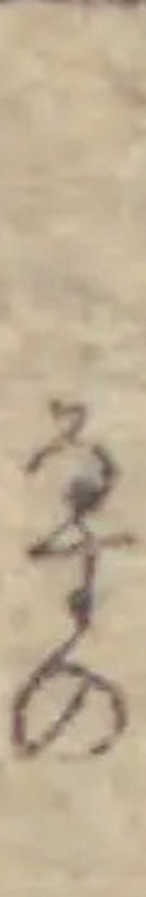るすの
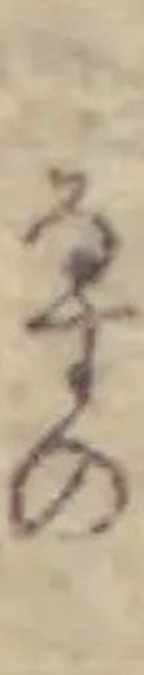るすの
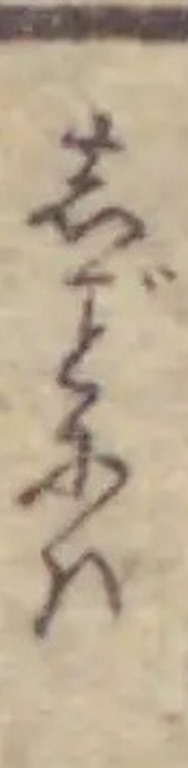しごとには
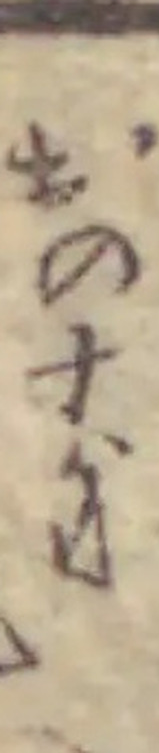おのすにも
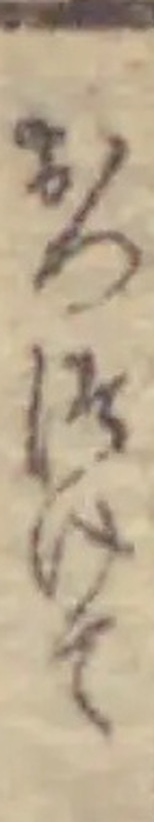おつつけて
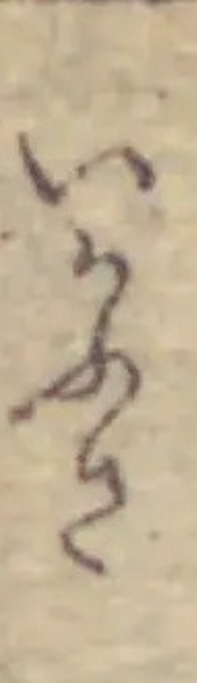いかふさ
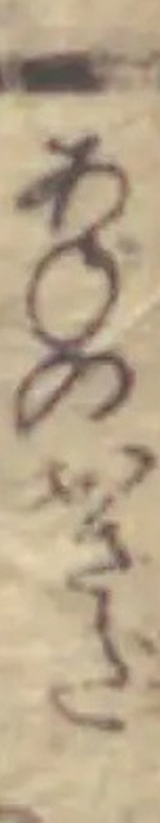あねのおさだ
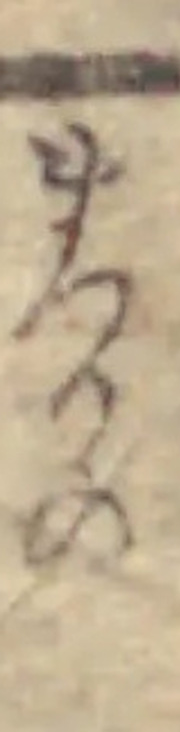まつりの
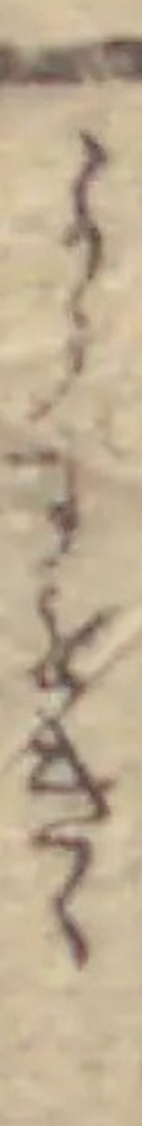ようすをきく
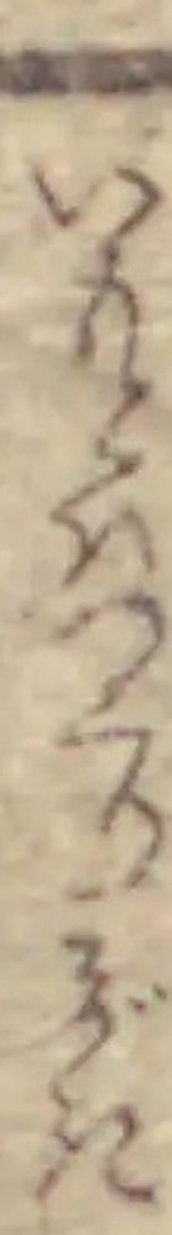いもとはつくりみがき
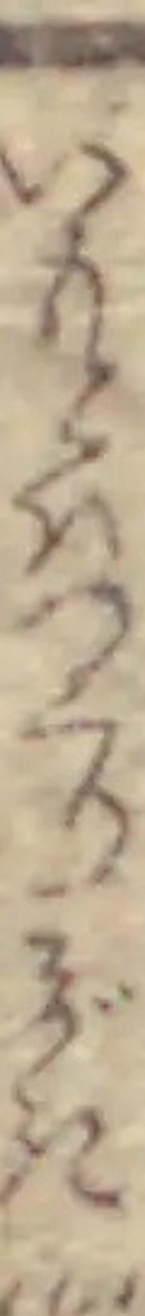いもとはつくりみがき
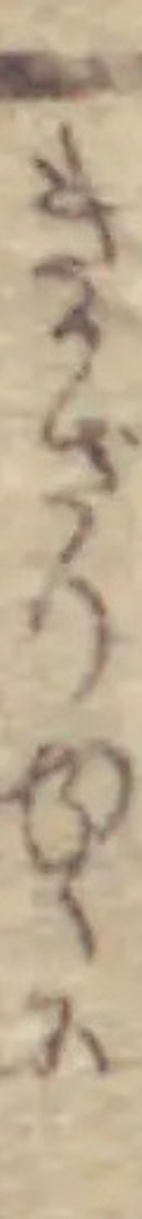きかざりゆくに
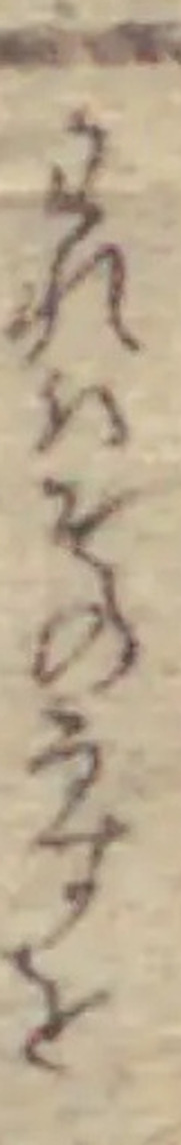われはそのるすを
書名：奥州咄 3巻
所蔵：国立国会図書館 National Diet Library, JAPAN
